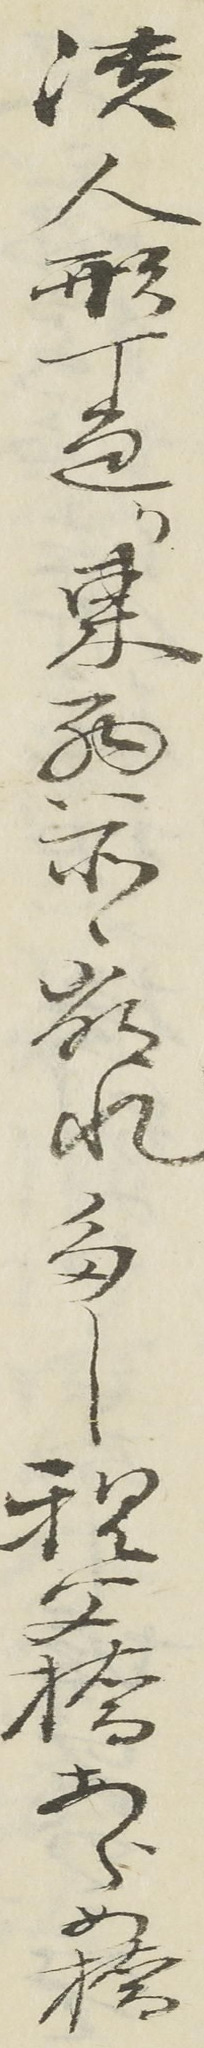潰人形丁通り東西ハ所〻崩れ多し親父橋あらめ橋
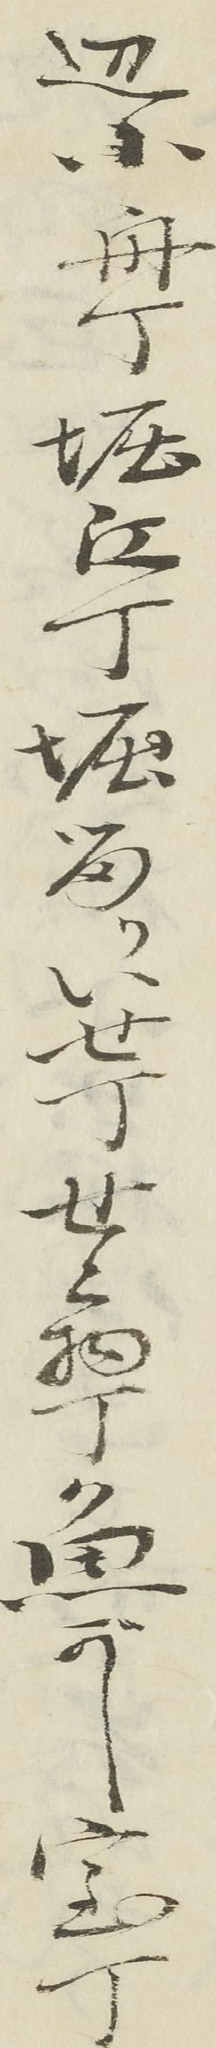辺小舟丁堀江丁堀留りいせ丁せと物丁魚がし宝丁
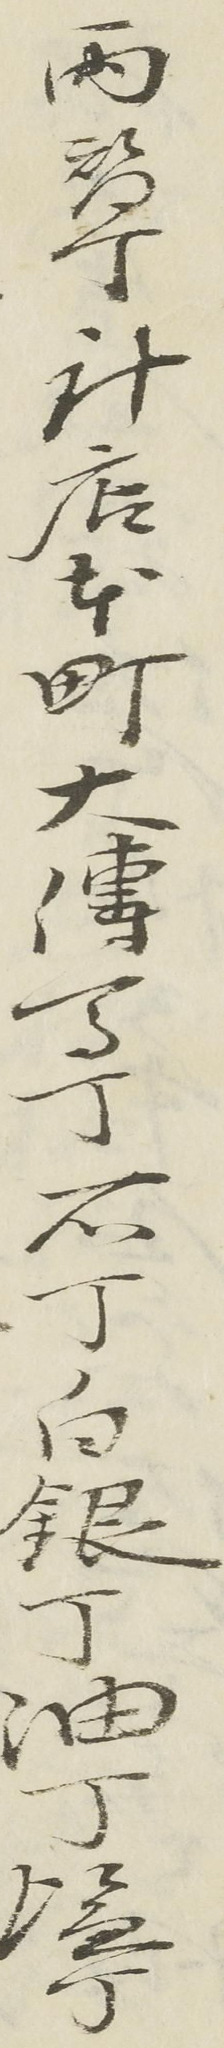両替丁汁店本町大傳馬丁石丁白銀丁油丁塩丁
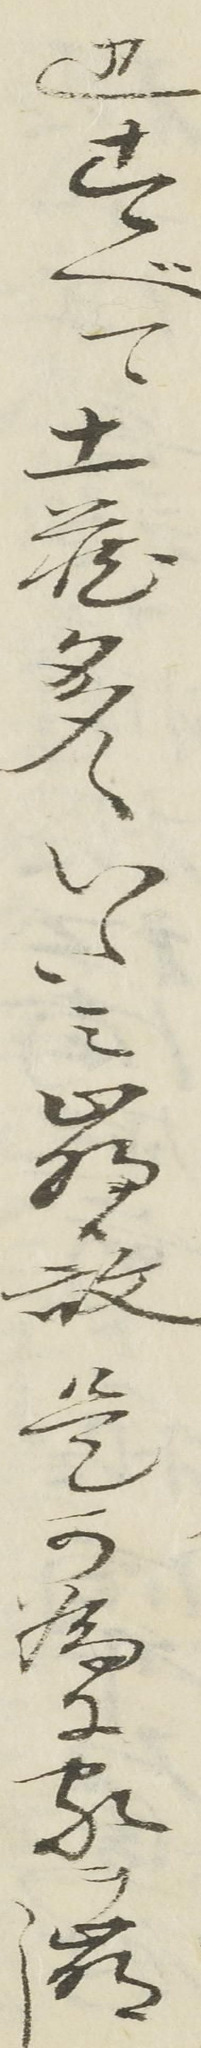辺すべて土蔵多くいたミ崩候故是か為に家ヲ崩し
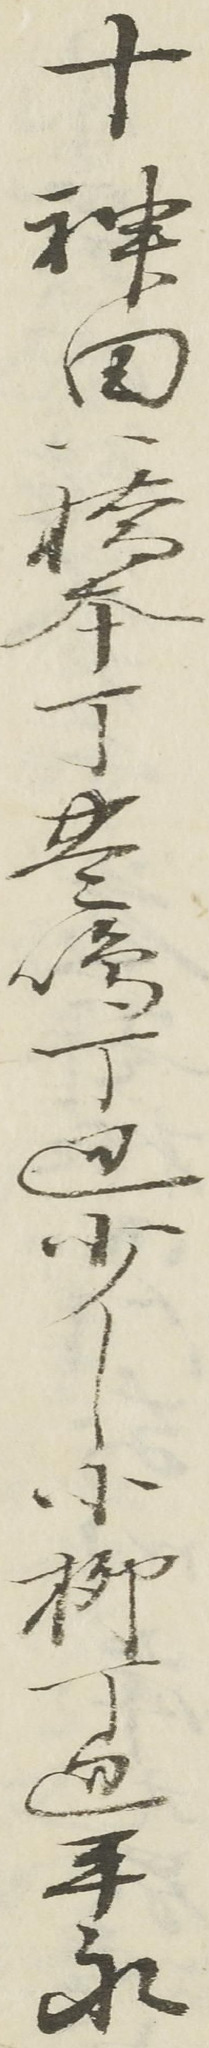十神田ハ橋本丁豊嶋丁辺少し小柳丁辺手永
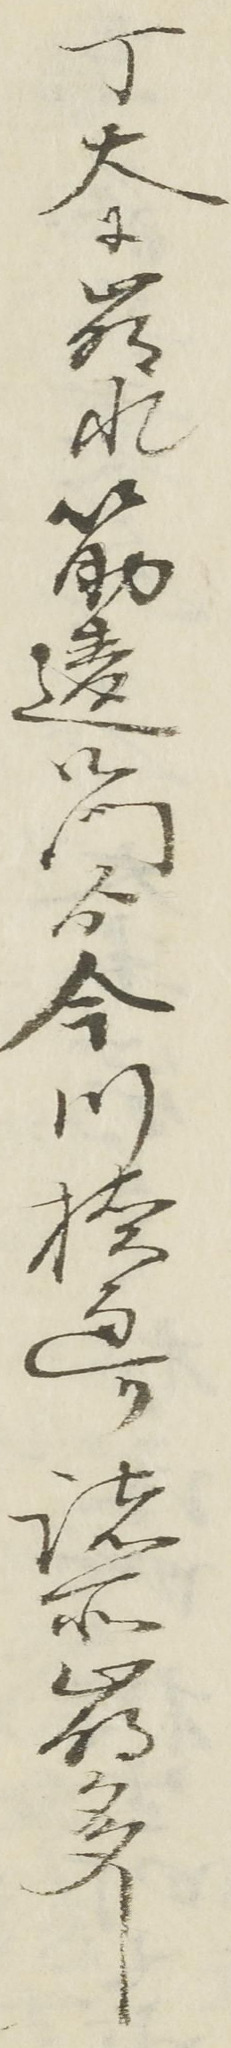丁大に崩れ筋違御門ゟ今川橋通り諸所崩多し
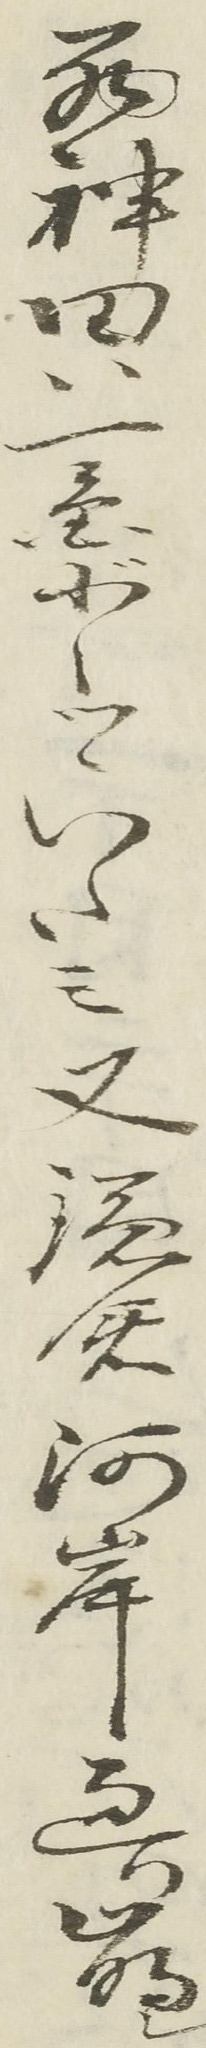西神田ハ一圓ハ少しツヽいたミ又鎌倉河岸通り崩レ
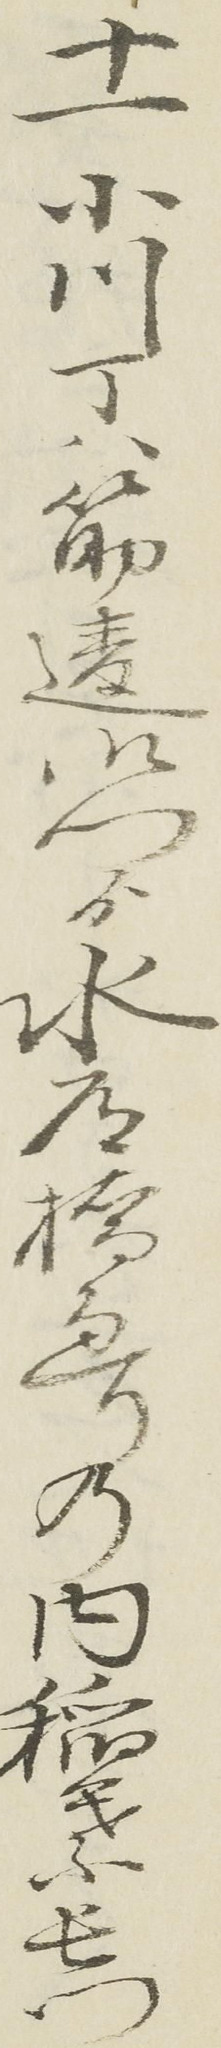十一小川丁ハ筋違御門ゟ水道橋通りの内稲葉長門
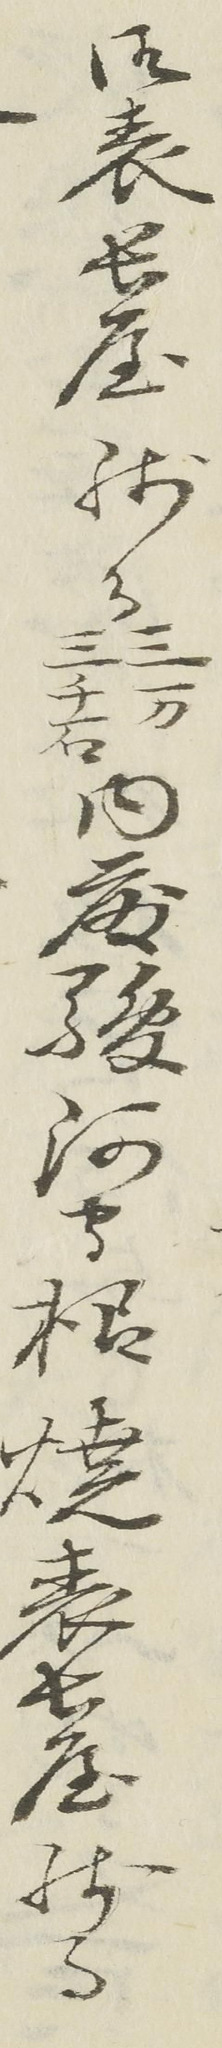御表長屋残る三万三千石内藤駿河守様焼表長屋残る
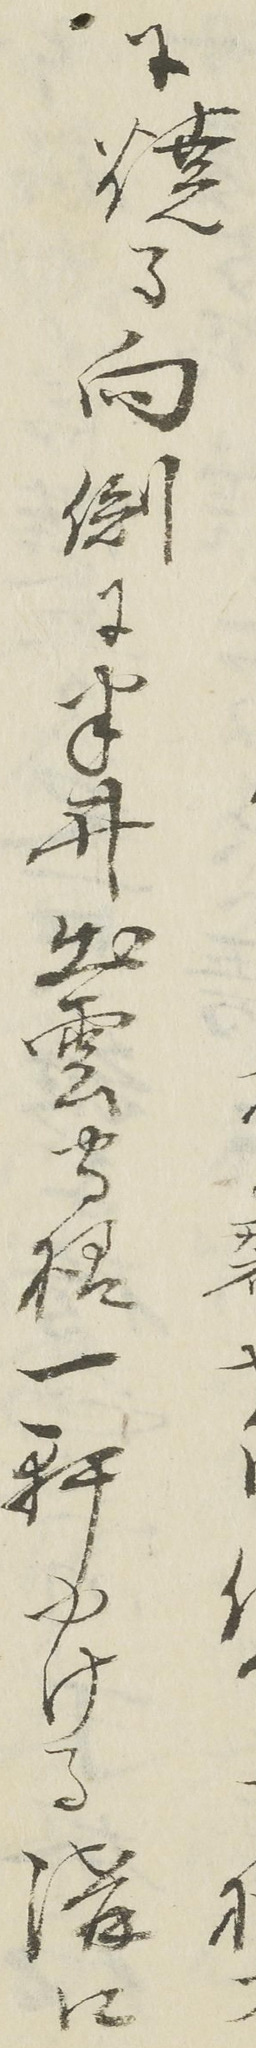に焼る向側に半井出雲守様一軒やける溝口
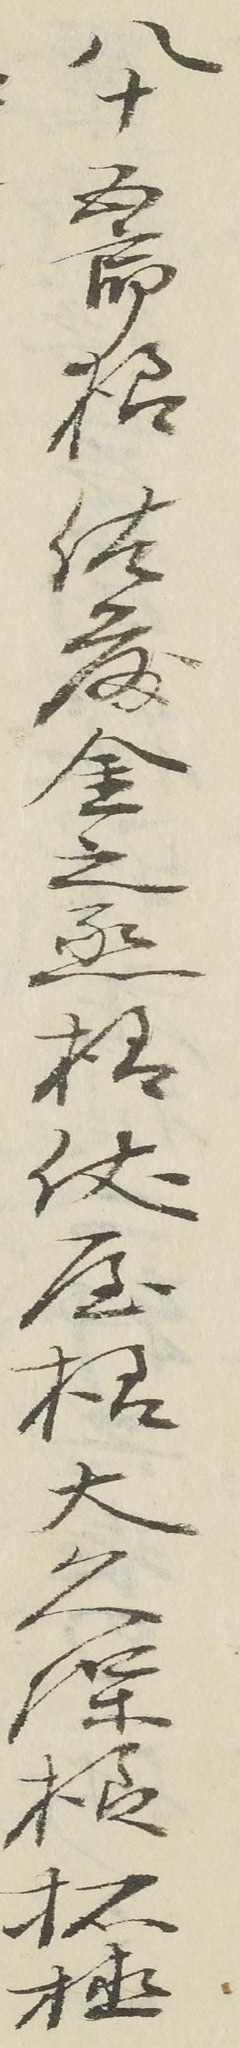八十五郎様佐藤金之丞様伏屋様大久保様柘植
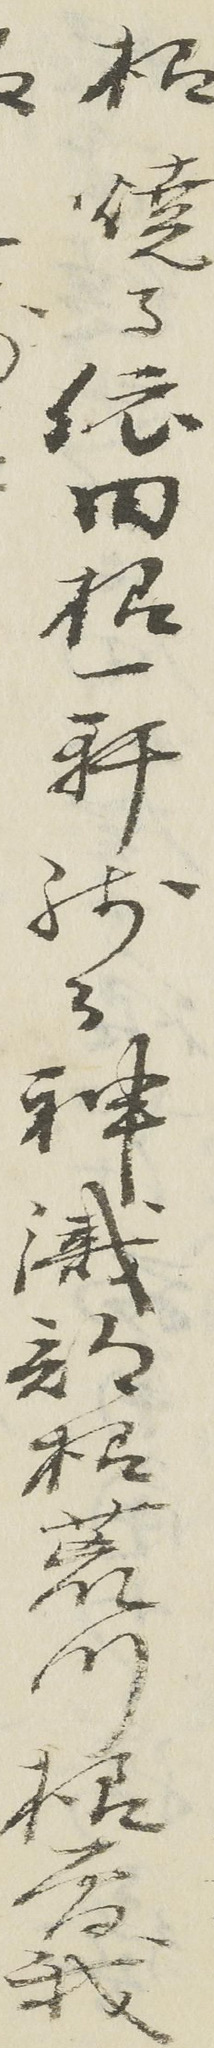様焼る依田様一軒残る神織部様荒川様曽我
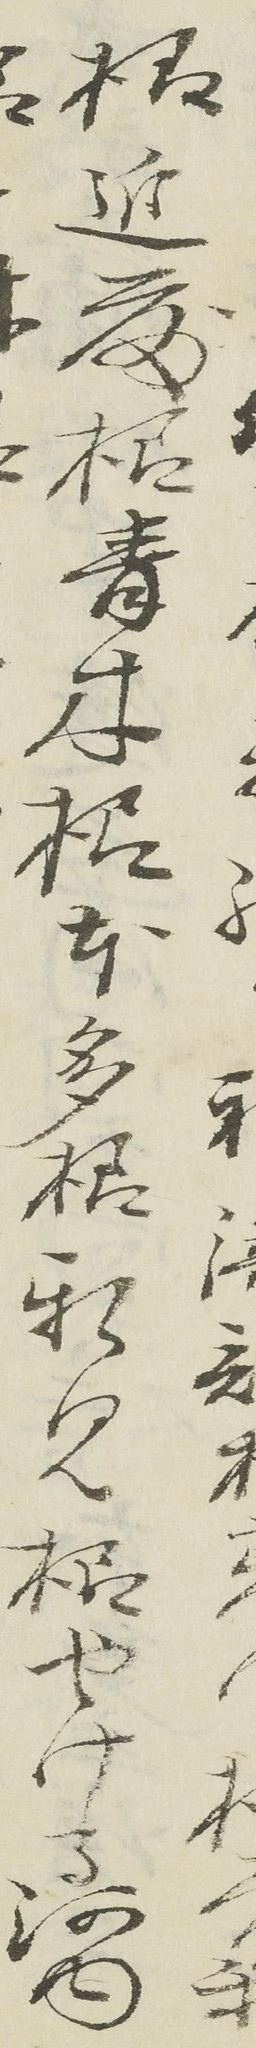様近藤様青木様本多様新見様やける河内
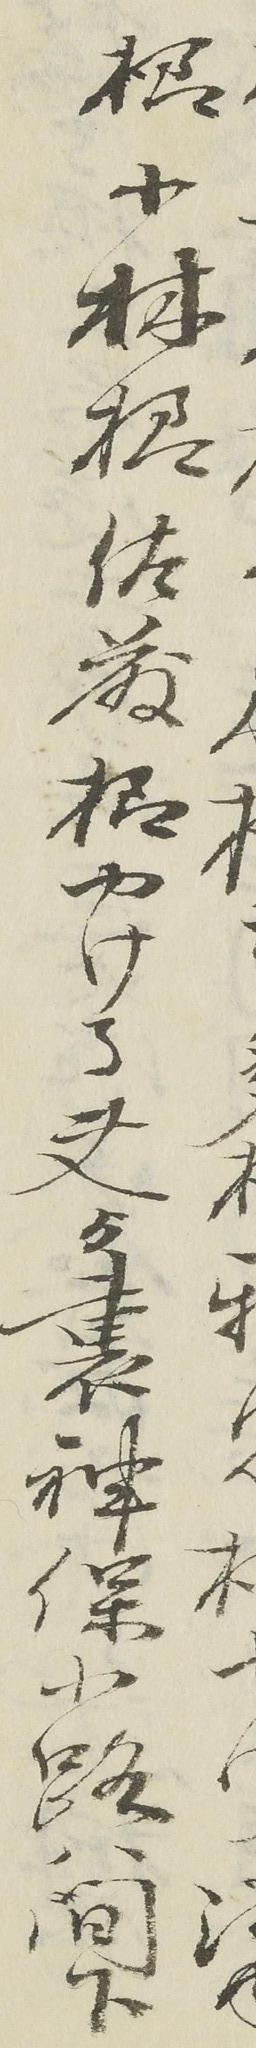様小林様佐藤様やける夫ゟ裏神保小路ハ間下
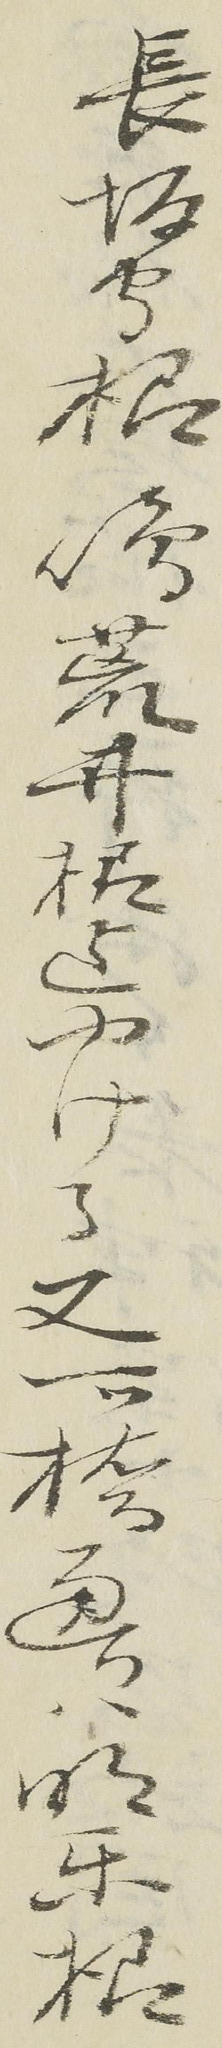長坂守様嶋荒井様迄やける又一ツ橋通りハ明楽様

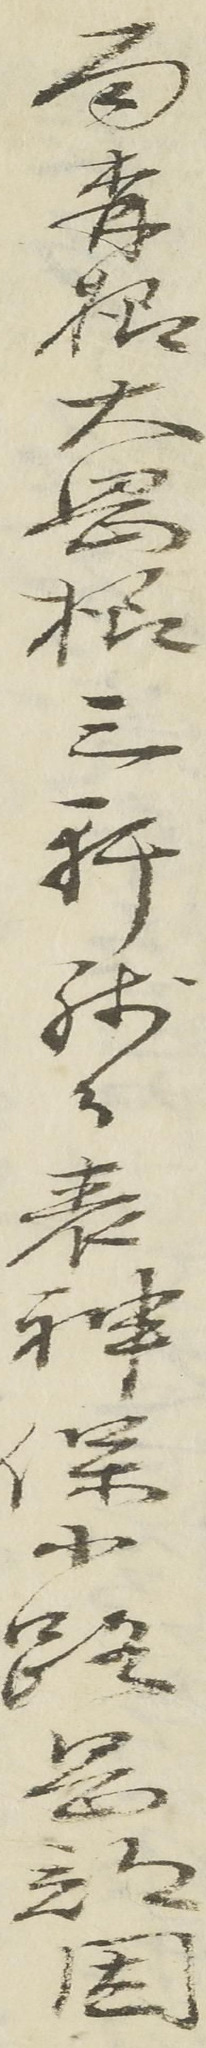雨森様大岡様三軒残る表神保小路岡部因
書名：安政乙卯江戸大地震筆記　安政丙辰八月大阪大雷雨之記追加　安政三辰年七月松前辺大地震并八月大風雨記録
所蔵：東京大学地震研究所図書室 Earthquake Research Institute Library, The University of Tokyo, JAPAN
